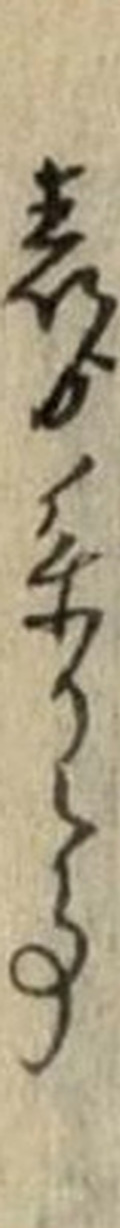表ゟ参り候事
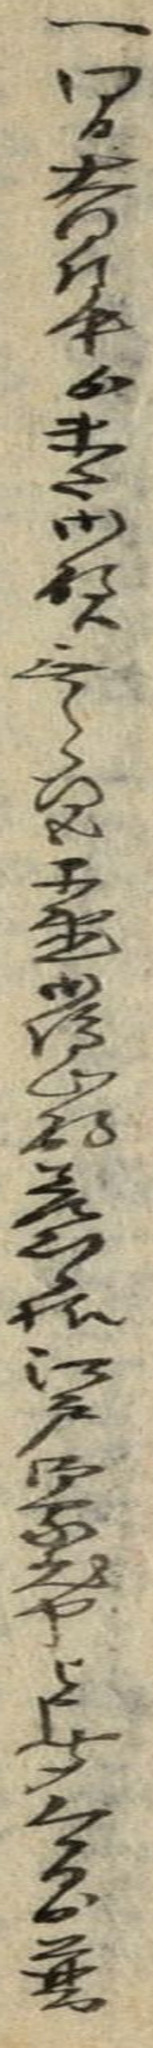一同日大目付中ゟ未た御触は無之候得共早速御停止触差出候様江戸御家老中被申聞今日ゟ普
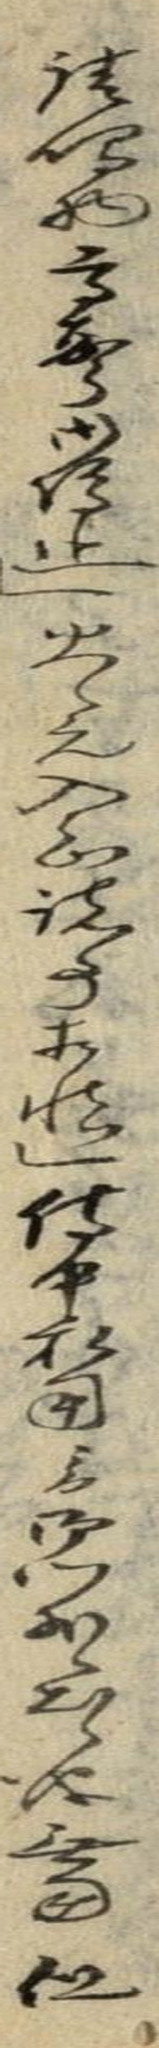請鳴物高声御停止」火之元入念諸事相慎」侍中私用にて御門外へ出候儀無用但
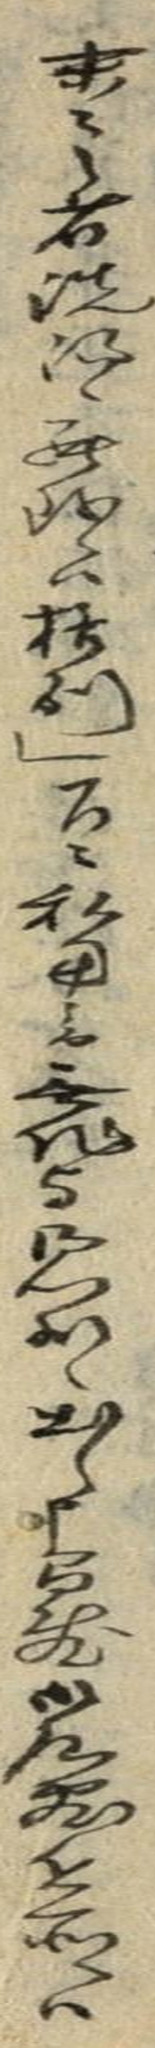末々之者洗湯へ罷越候は格別」下々私用にて無作と御門外へ出し申間敷御屋敷近所へは
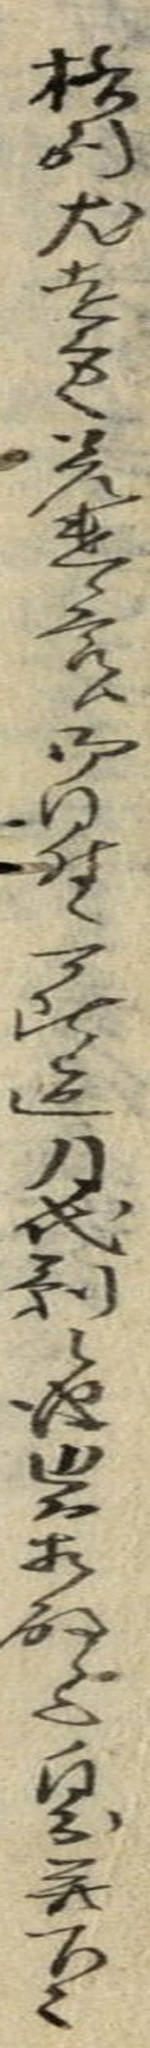格別尤遠方へ差遣候節は御目付へ可断旨」月代剃之儀追て相触候迄自分并下々
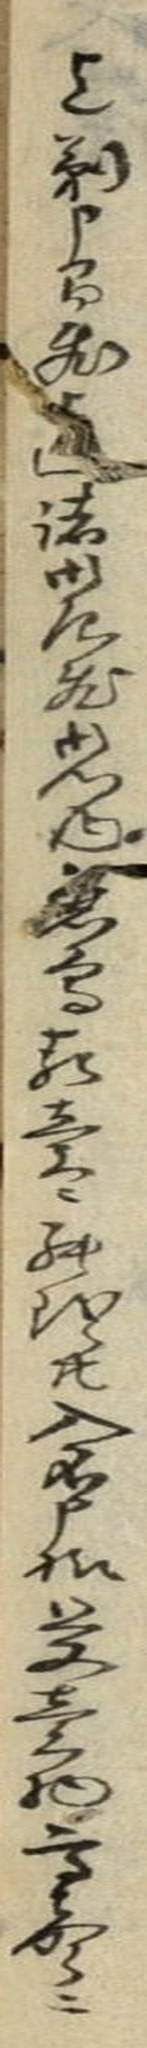迄剃申間敷旨」諸御屋敷御門内魚鳥類売に罷越候共入不申様且又売物高声に
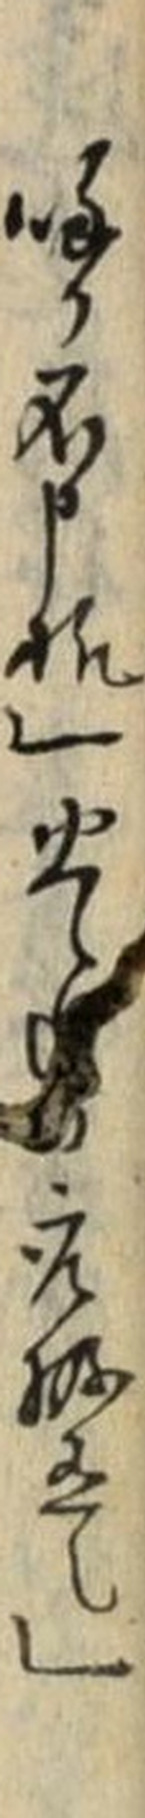呼り不申様」火之取扱有之」
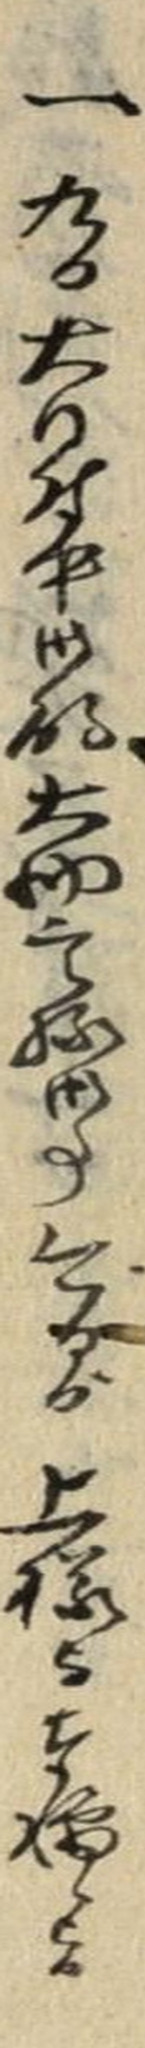一九日大目付中御触大納言様御事今日ゟ上様と奉称候旨
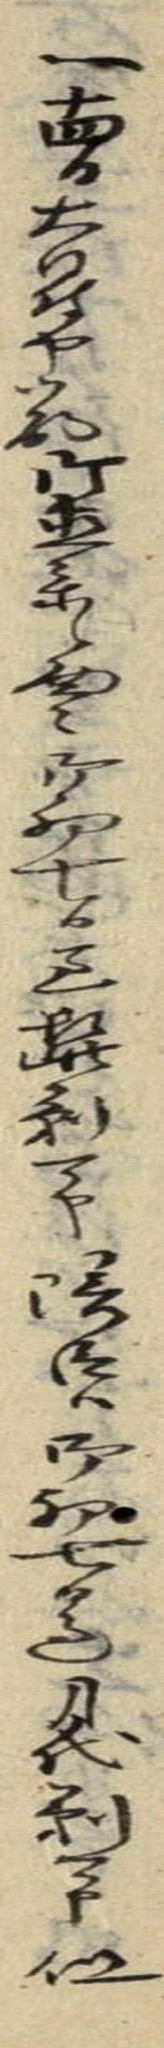一十四日大目付中御触御直参之面々御初七日過髭剃可申陪臣は御初七日過月代剃可申但
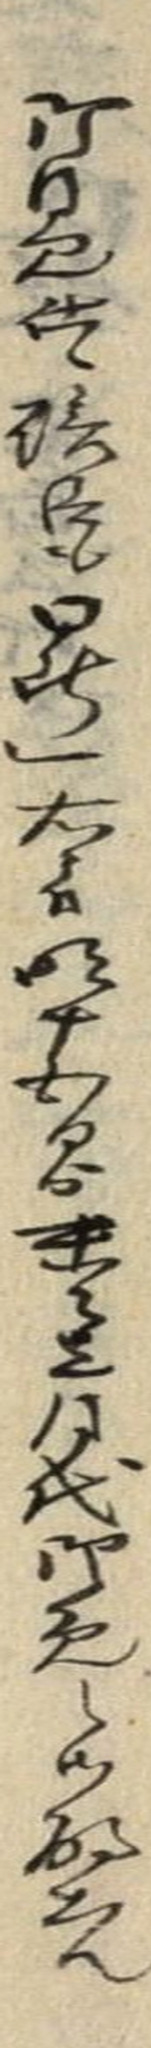御目見仕候陪臣も同断」右に付明十五日ゟ末々迄月代御免之御触出ル
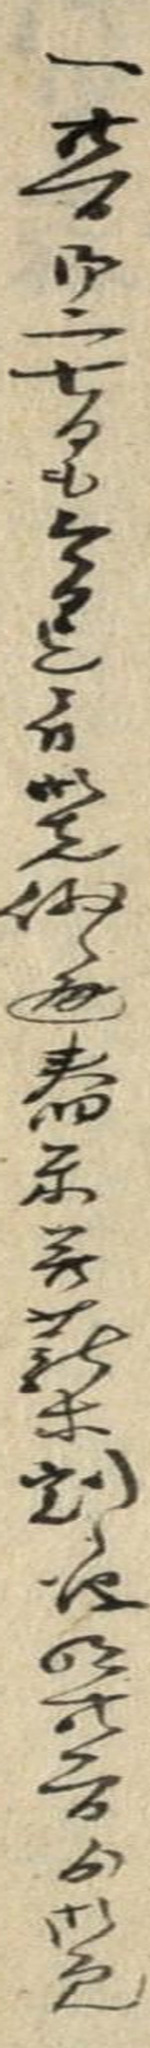一廿一日御二七日も今日迄に付御先例之通舂米并薪等割候儀明廿二日ゟ御免
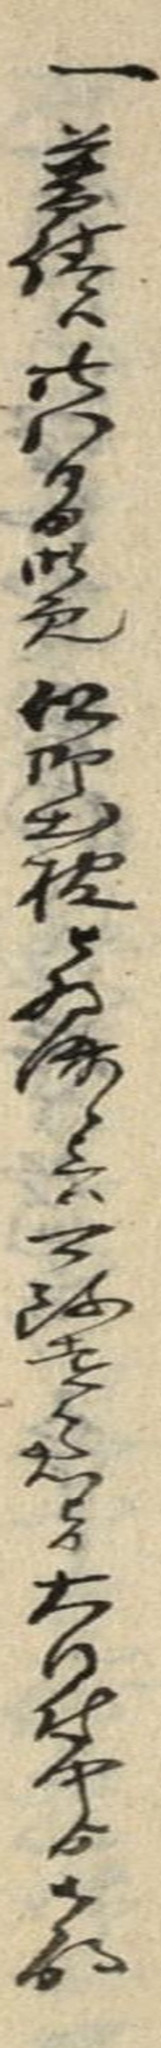一普請は廿八日ゟ御免但御出棺被為済候迄は可致遠慮旨大目付中ゟ御触
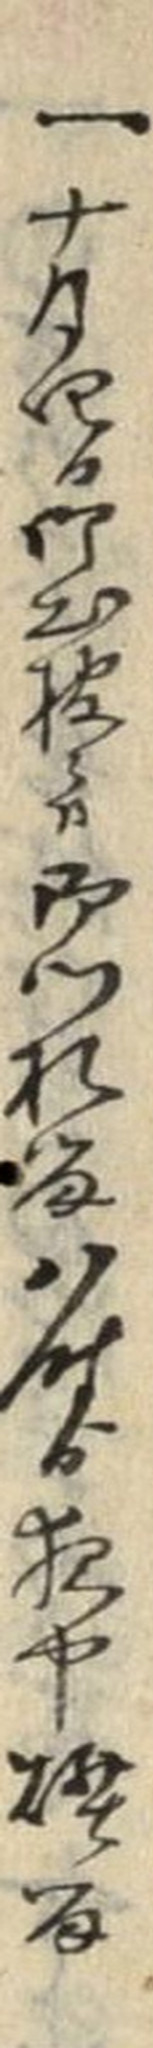一十月四日御出棺に付御門札留八時ゟ夜中灯留
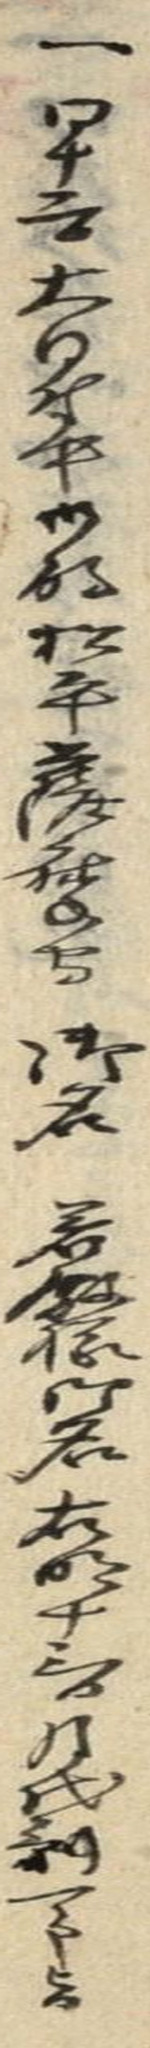一同十二日大目付中御触松平薩摩守御名若殿様御名右明十三日月代剃可申旨
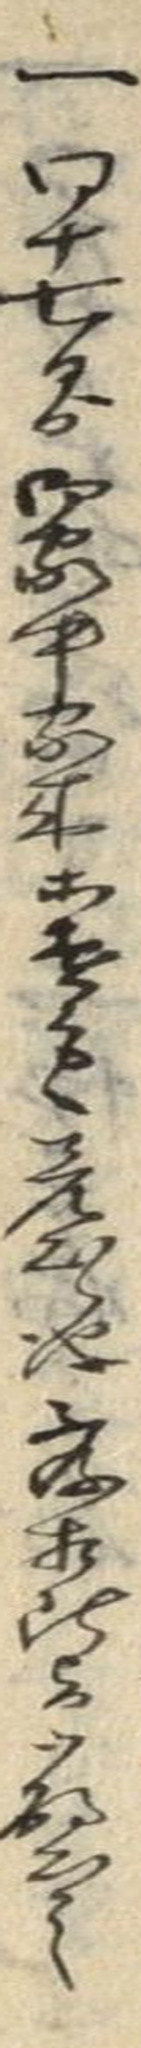一同十七日ゟ御家中家来等遠方へ差出候儀不及相断旨御触出之
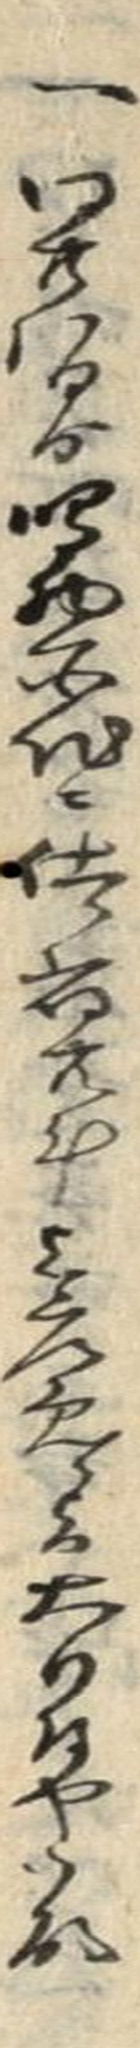一同廿八日ゟ鳴物所作に仕候者共斗迄差免候旨大目付中御触
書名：御停止異変死失
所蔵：福井県文書館 Fukui Prefectural Archives
